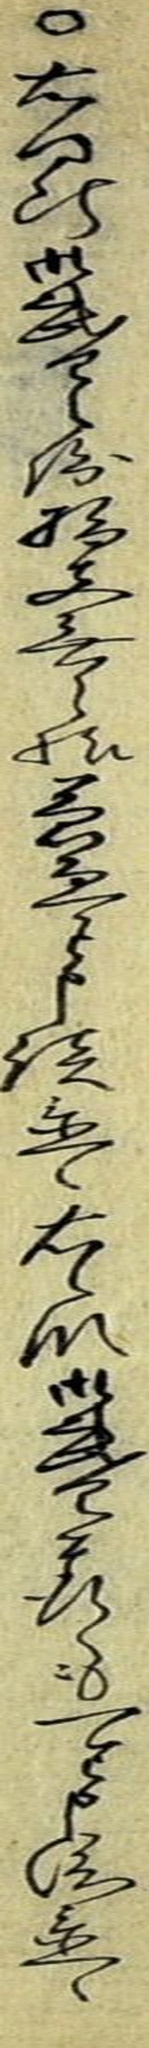〇右同断御武具之儀指支無之様兼而可被申談置候右之段御武具奉行へも可被申渡置候
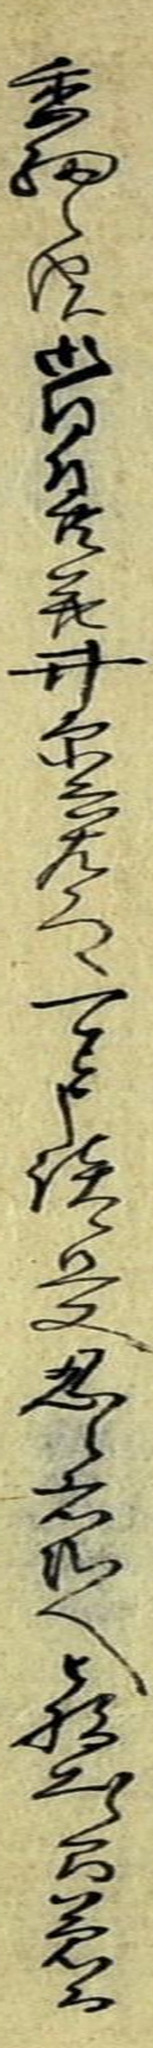委細之儀ハ御目付共并井原兵左衛門へ可被申談候且又忍之者弐人被指出候間兼而
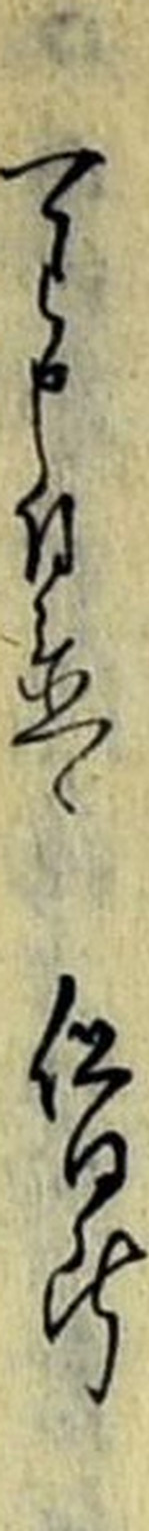可被申付置候但同断
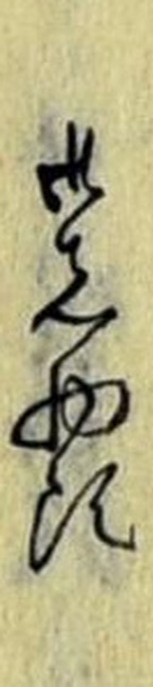御先物頭
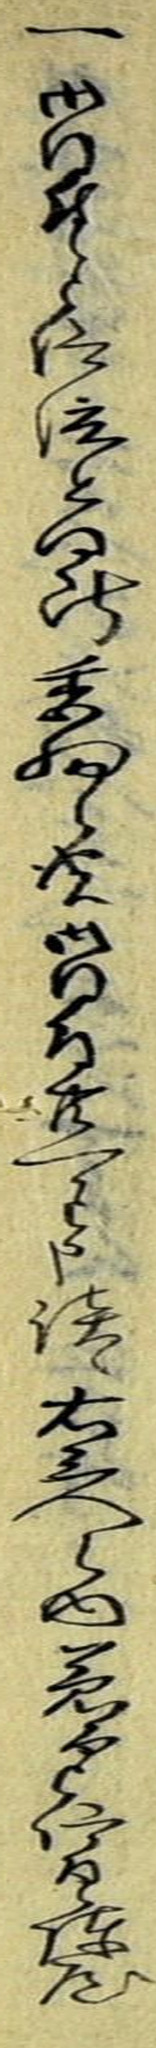一御目付へ被仰渡と同断委細之儀ハ御目付共可被申談候右三人之内兼而被仰付候陣屋

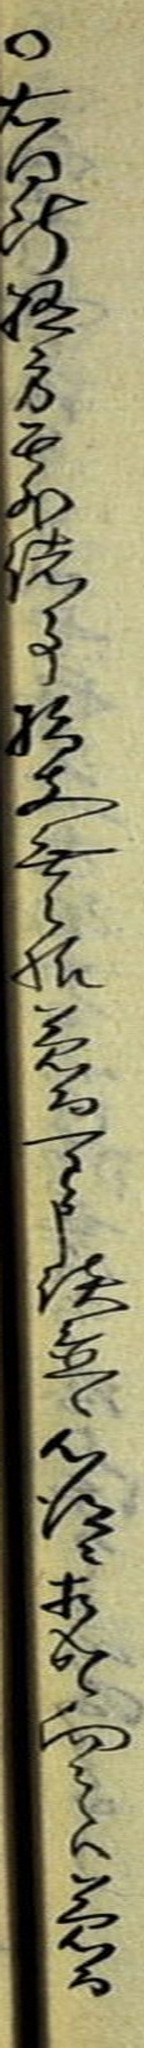〇右同断賄方其外諸事指支無之様兼而可被申談置候心得ニ相成候向々ヘハ兼而
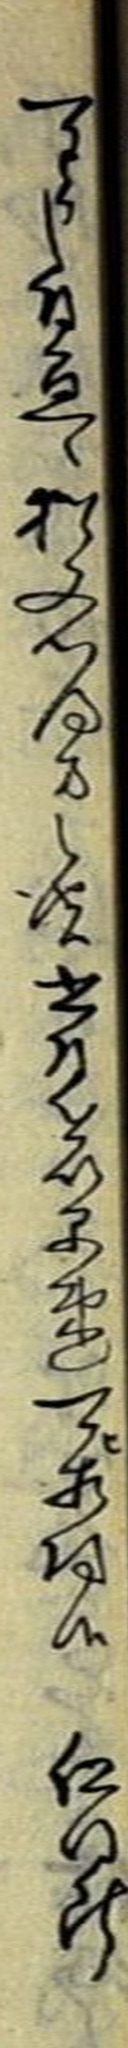可被申付置候猶又心得方之儀ハ書付を以早速可被相伺候但同断

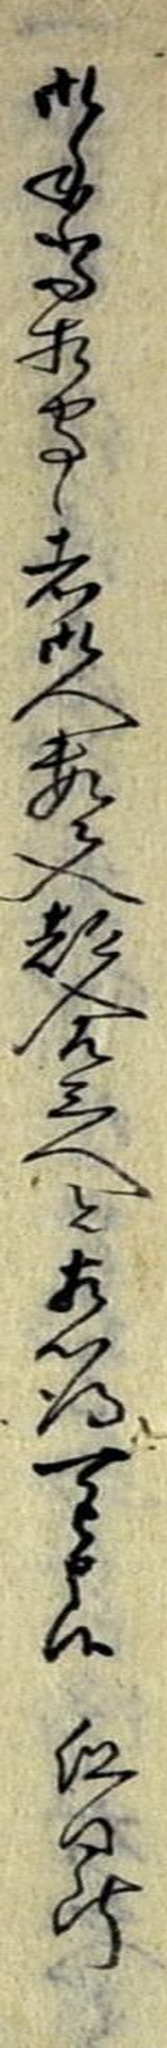御手当相守候者弐人数ニ入都合三人と相心得可被申候但同断
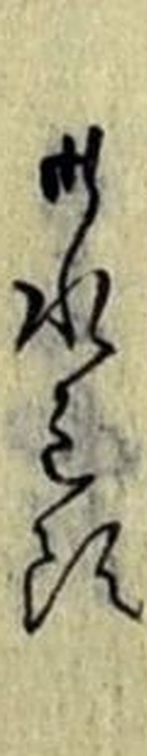御水主頭
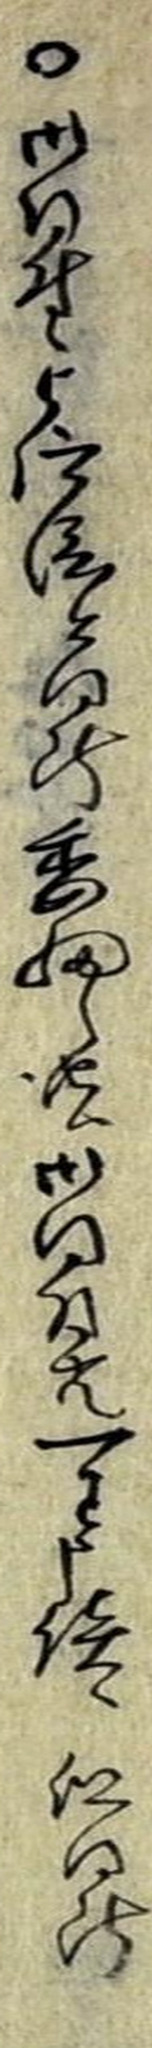〇御目付へ被仰渡と同断委細之儀ハ御目付共可被申談候但同断
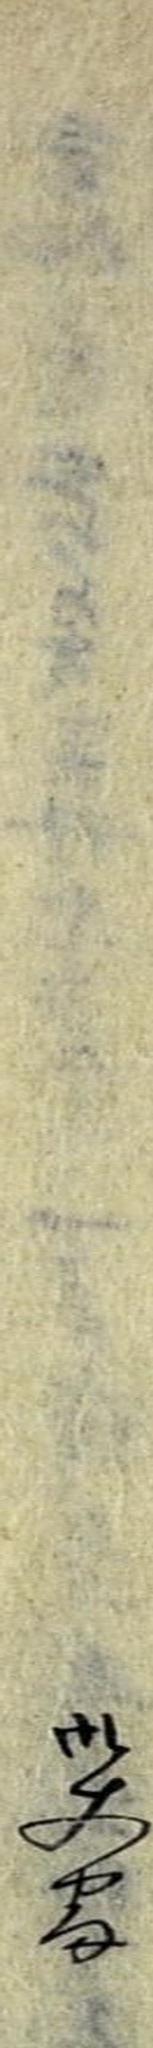御使番
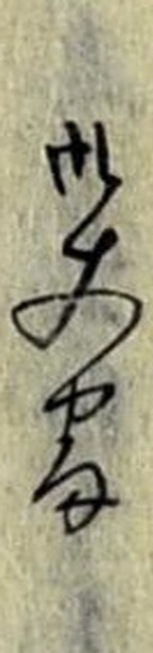御使番
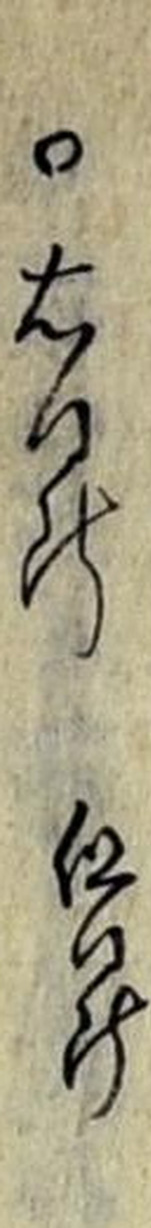〇右同断但同断
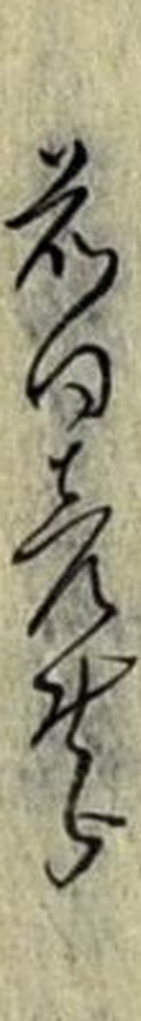前田彦次郎
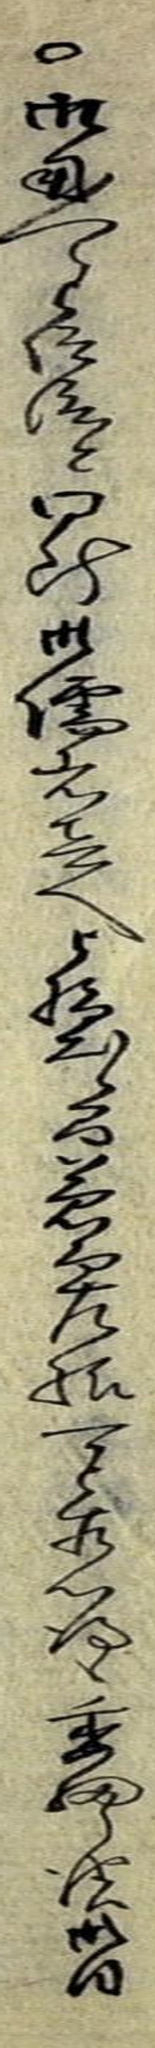〇御用人へ被仰渡と同断御儒者壱人被指出候間兼而左様可被相心得候委細之儀ハ御目
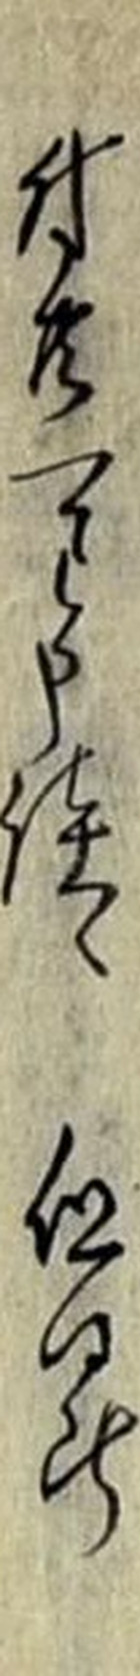付共可被申談候但同断
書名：命令之部 三
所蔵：福井県文書館 Fukui Prefectural Archives
